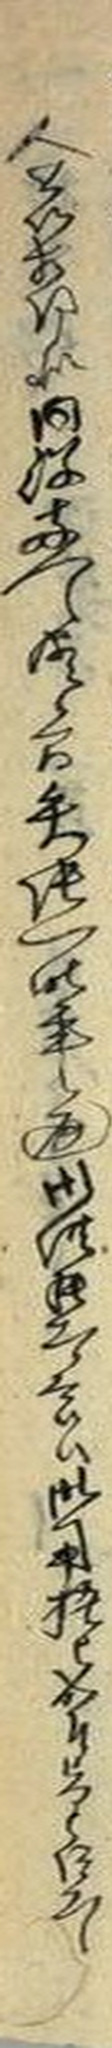人を以相伺候処同役両人之儀ニ候間矢張一昨年之通御供罷出候節ハ御用捨被成候旨被仰出候
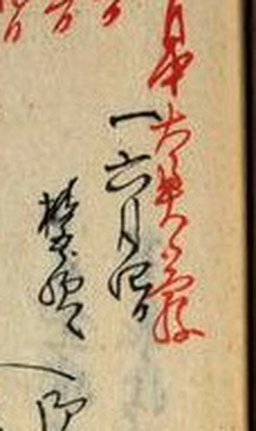一六月四日
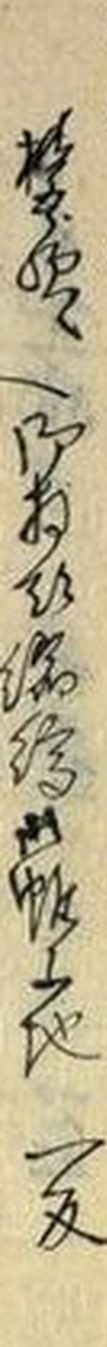揩五郎様へ御拝領縮縞御帷子地一反
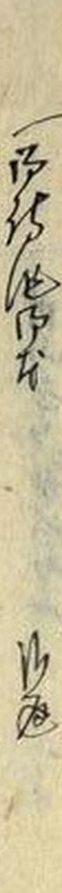御詩作御本弐通
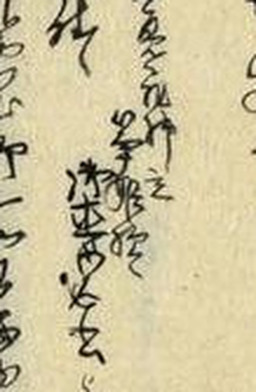箏姫様へ
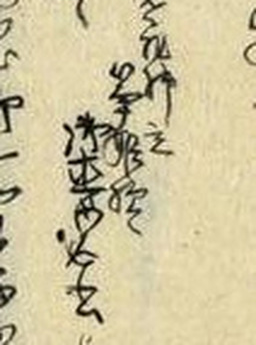箏姫様へ
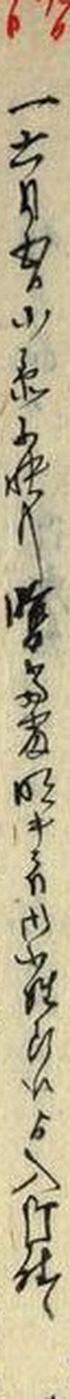一六月五日小兵衛不快引昨日当番明キニ付御小姓頭取ゟ入御聴候
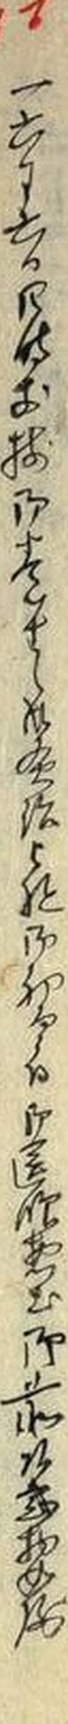一六月六日四時前揃御養生之御灸治被遊御初而ニ付御医師惣出御前頂戴物如例
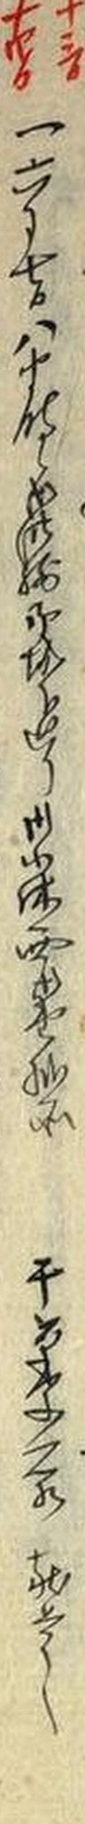一六月七日八半時之御供揃御城下廻り御小休西御堂掛所干菓子一箱献上之
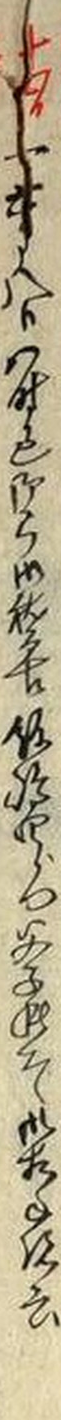一六月八日八時過御弓御稽古飯嶋四郎右衛門父子罷出候御相手弥六
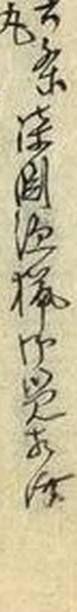丸漆渕漁猟御覧相済
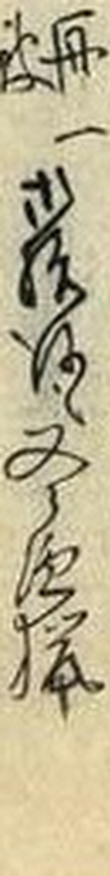艘御膳後も又々漁猟
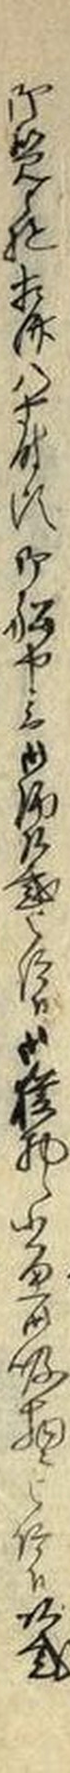御覧被遊相済八半時頃御船中ニ而御酒頂戴被仰付御獲物小魚御吸物被仰付頂戴
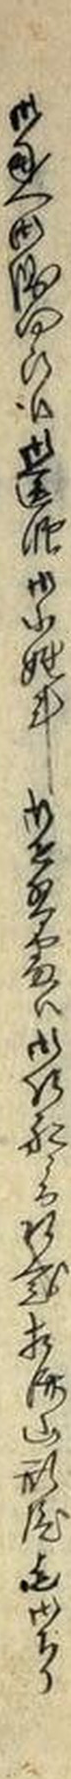御用人御側向頭取御医師御小姓斗御近習番ハ御次船ニ而頂戴相済山形渡迄御下り
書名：少傅日録抄（斉承付側向頭取日記、在国）
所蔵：福井県文書館 Fukui Prefectural Archives
